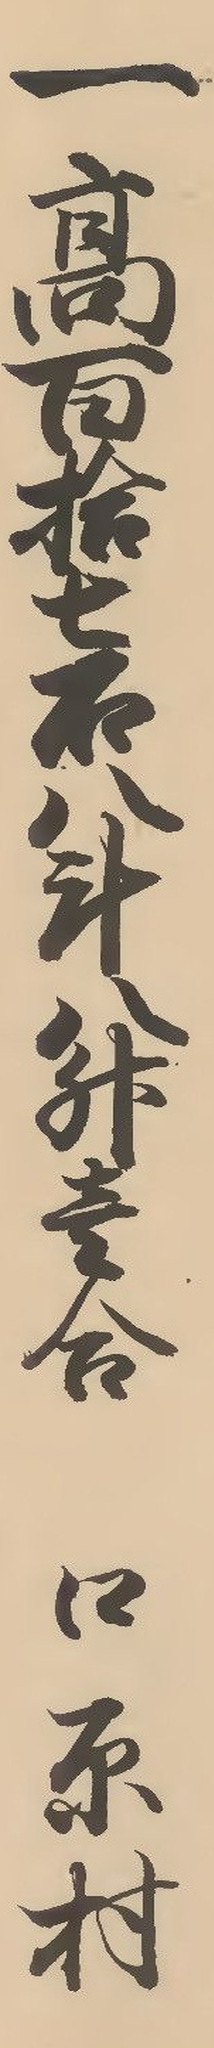一髙百拾七石八斗八升壱合口原村
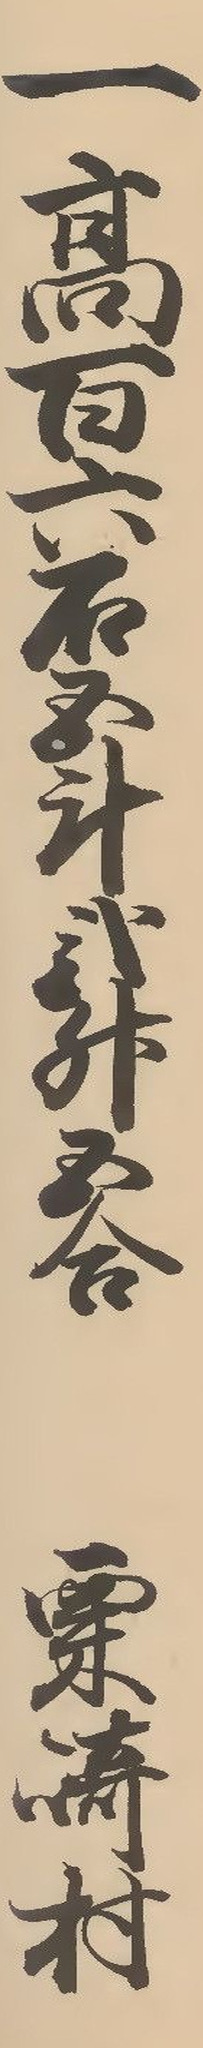一髙百六石五斗弐升五合栗崎村
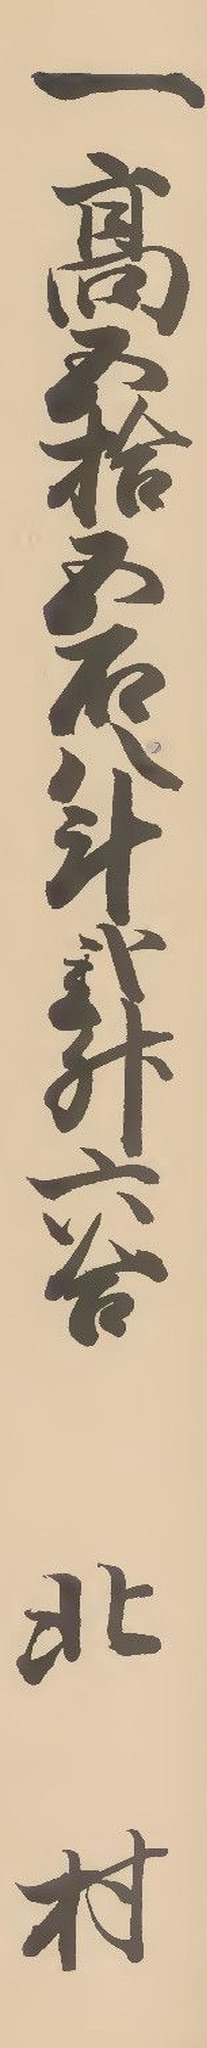一髙五拾五石八斗弐升六合北村
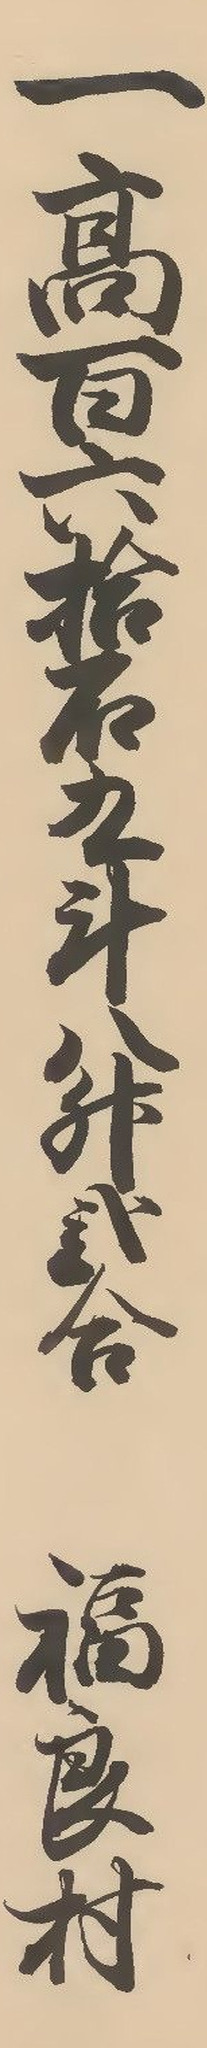一髙百六拾石九斗八升弐合福良村
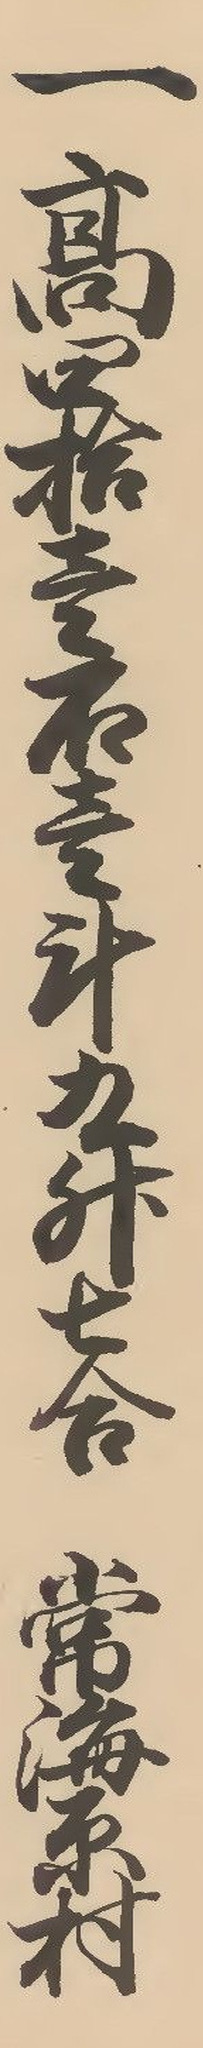一髙四拾壱石壱斗九升七合常海原村
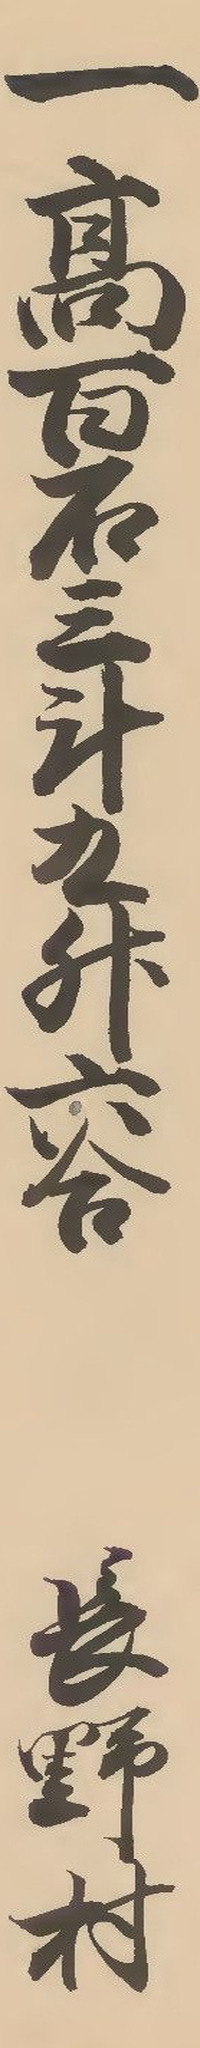一髙百石三斗九升六合長野村

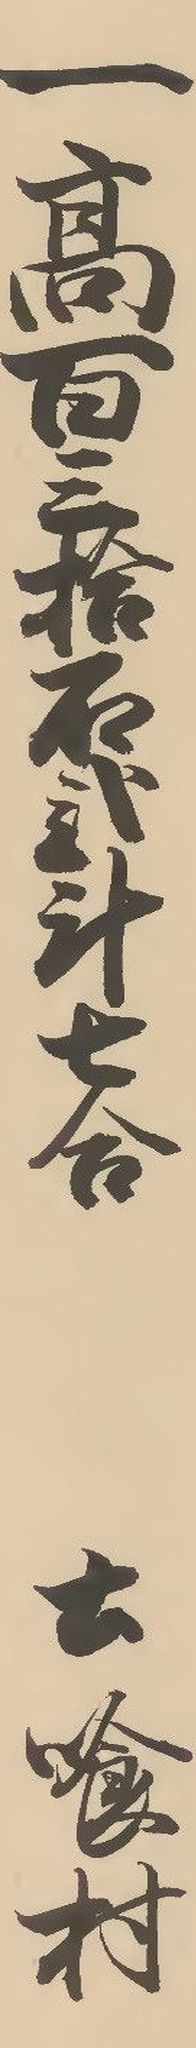一髙百三拾石弐斗七合土喰村
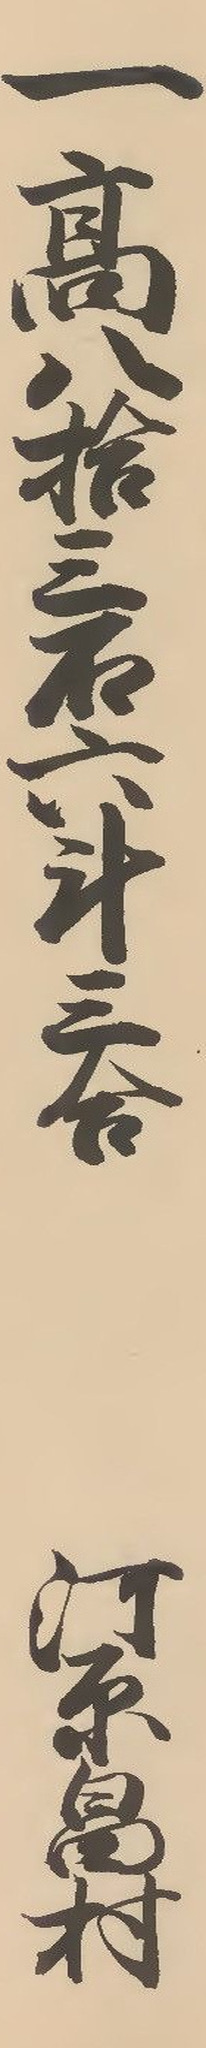一髙八拾三石六斗三合河原畠村
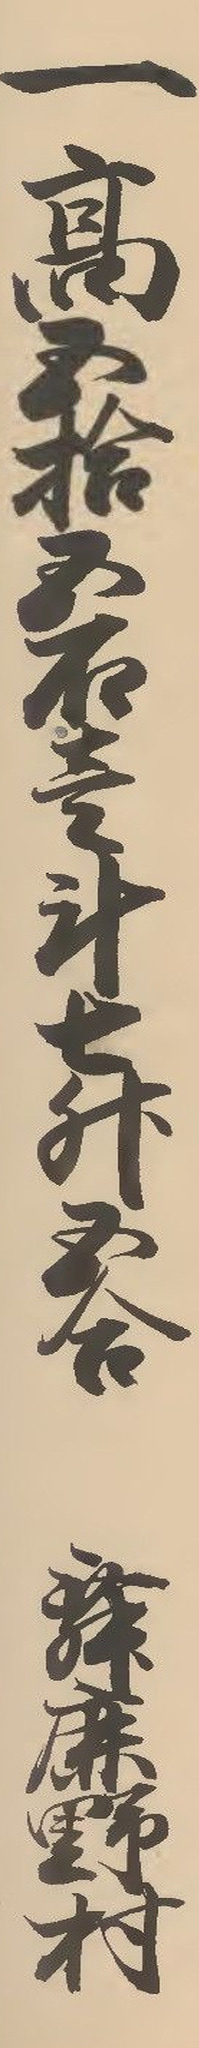一髙五拾五石壱斗七升五合舞鹿野村
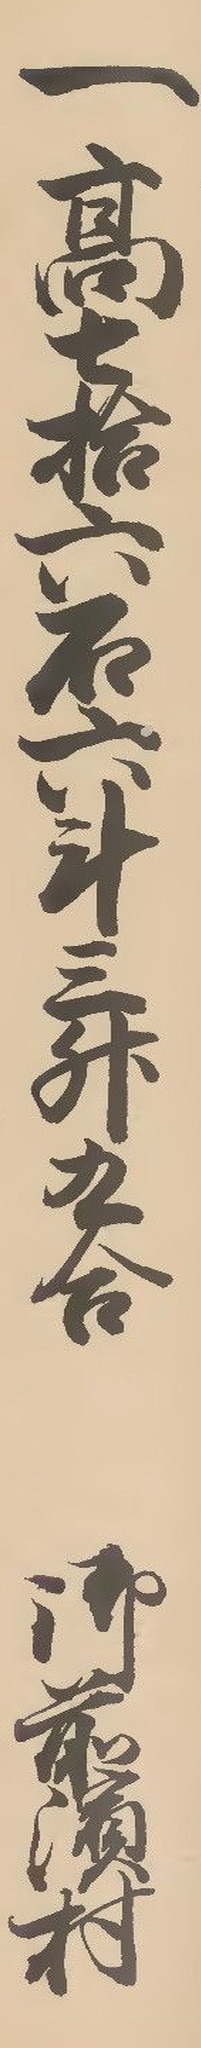一髙七拾六石六斗三升九合御前濱村
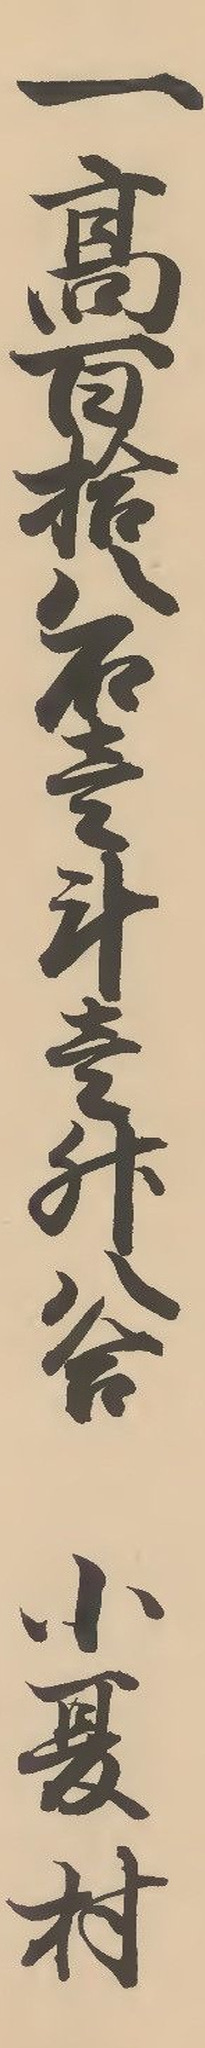一髙百拾八石壱斗壱升八合小夏村
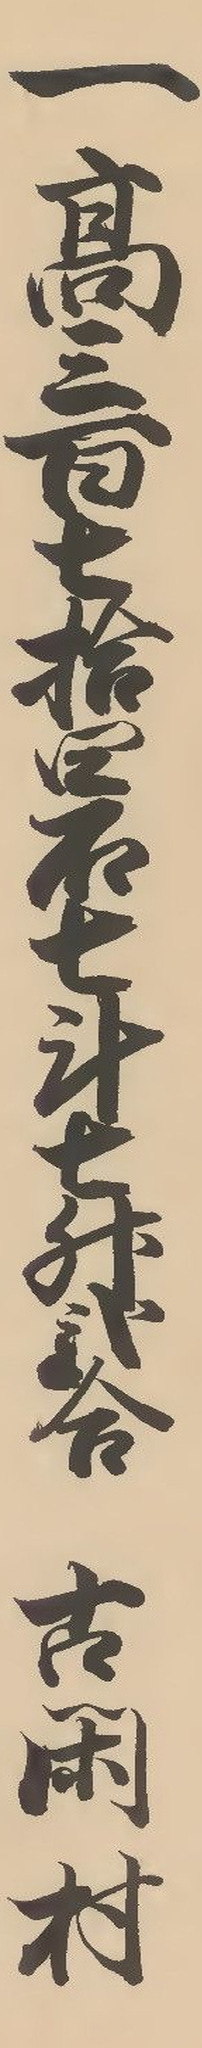一髙三百七拾四石七斗七升弐合古閑村
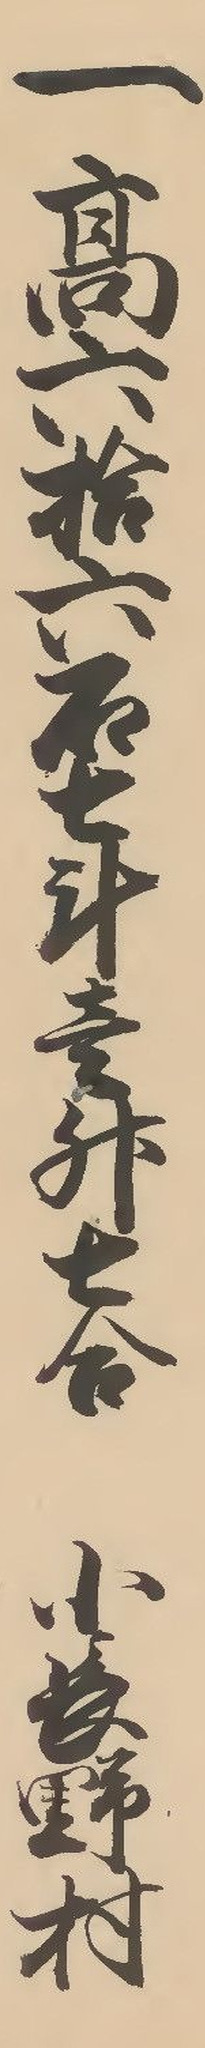一髙六拾六石七斗壱升七合古長野村

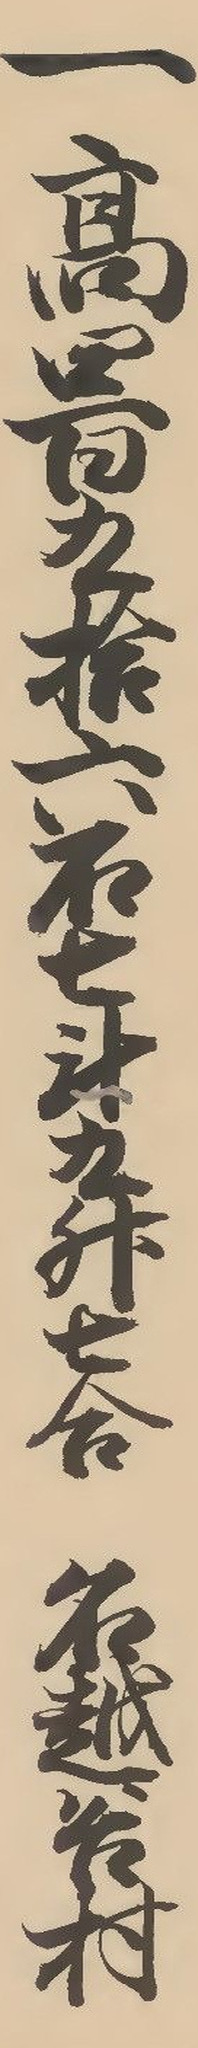一髙四百九拾六石七斗九升七合名越谷村
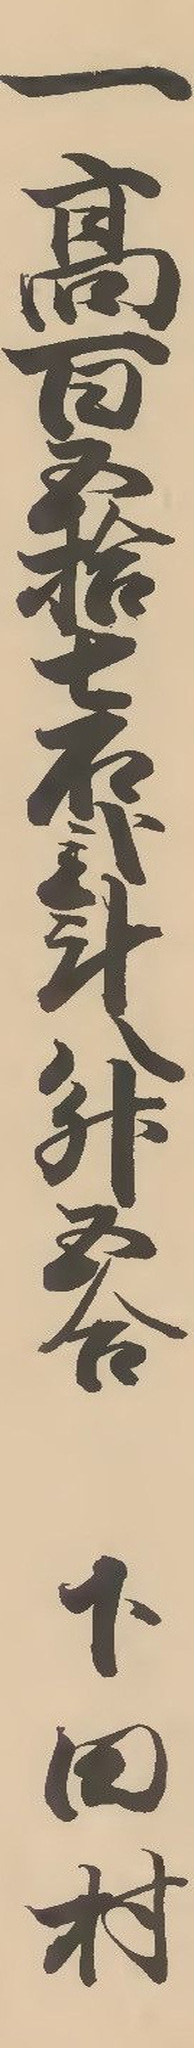一髙百五拾七石弐斗八升五合下田村
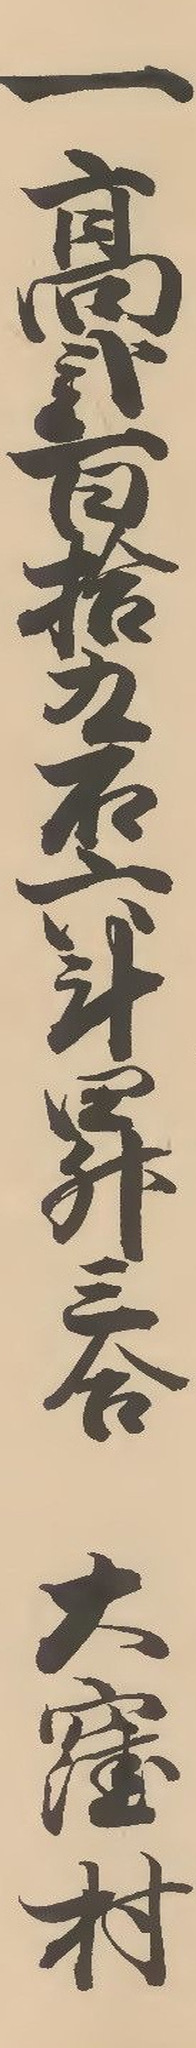一髙弐百拾九石六斗四升三合大窪村
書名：肥後国郷帳
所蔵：国立公文書館 National Archives of Japan
